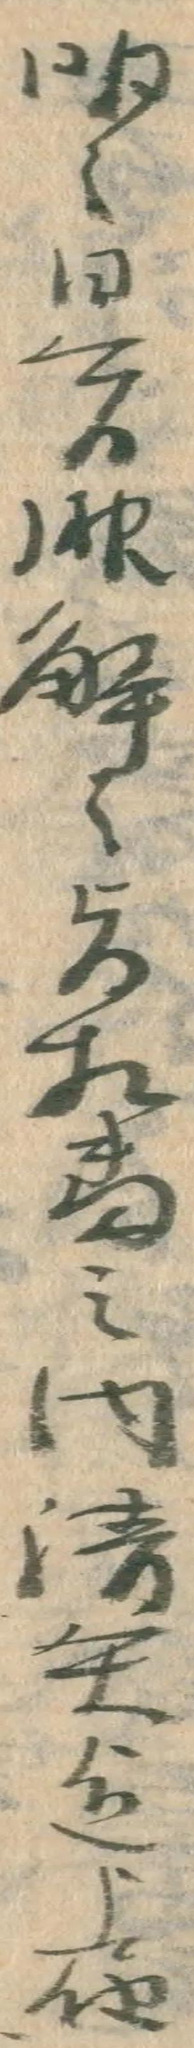明之日、今日服解之旨相番之内清矢迄申届也、
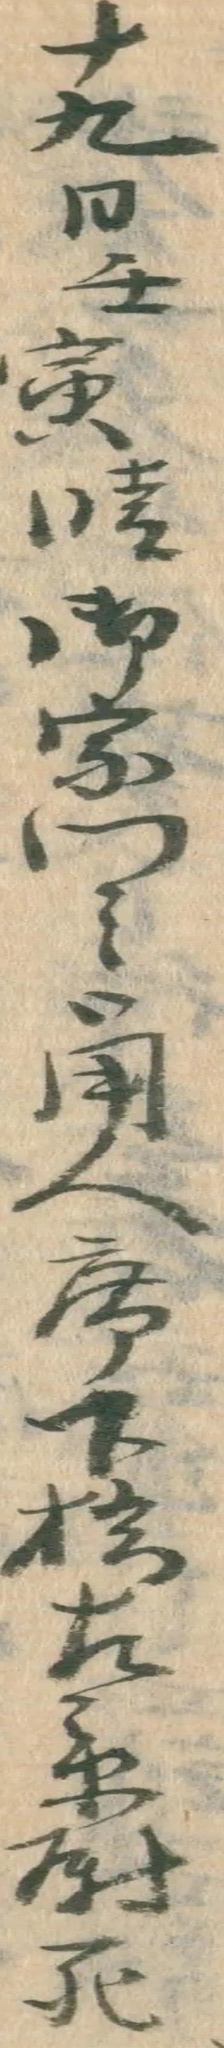十九日壬寅晴、御家門之御用人席下橋左兵衛尉死
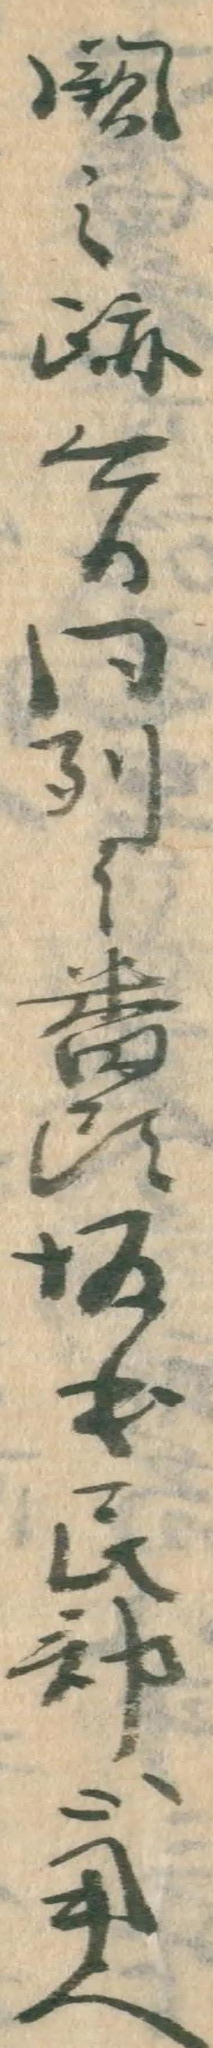闕之跡、今日同列之番頭坂本民部へ御用人
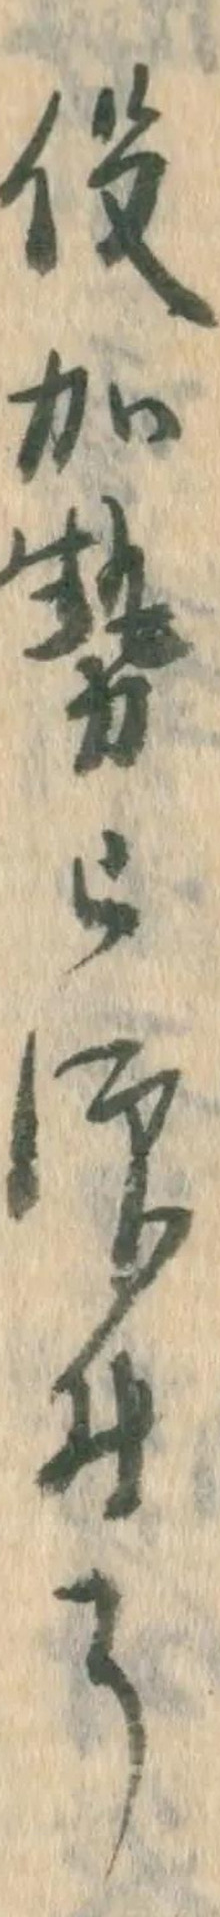役加勢被仰付了、
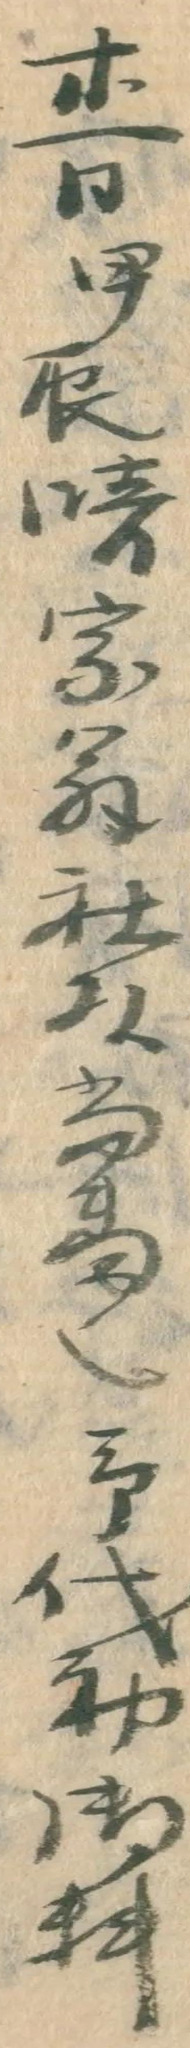廿一日甲辰晴、家翁社頭當番也、予代勤、御料

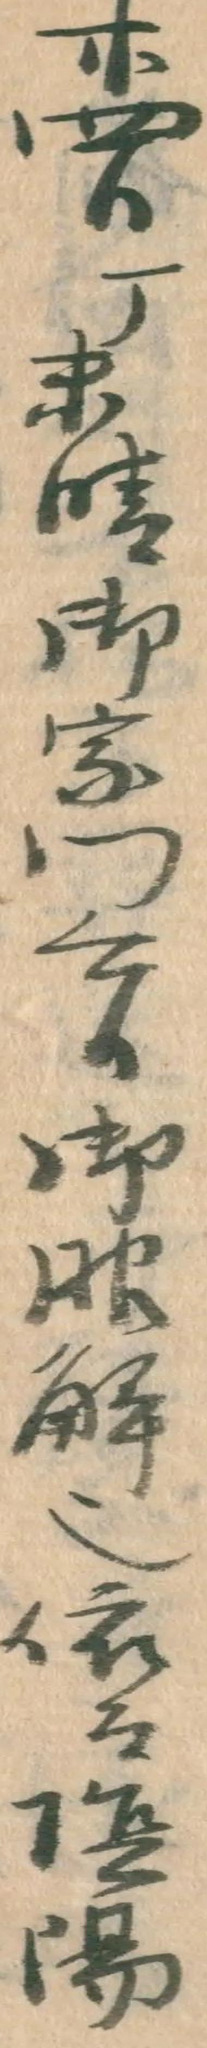廿四日丁未晴、御家門今日御眼解也、依而陰陽
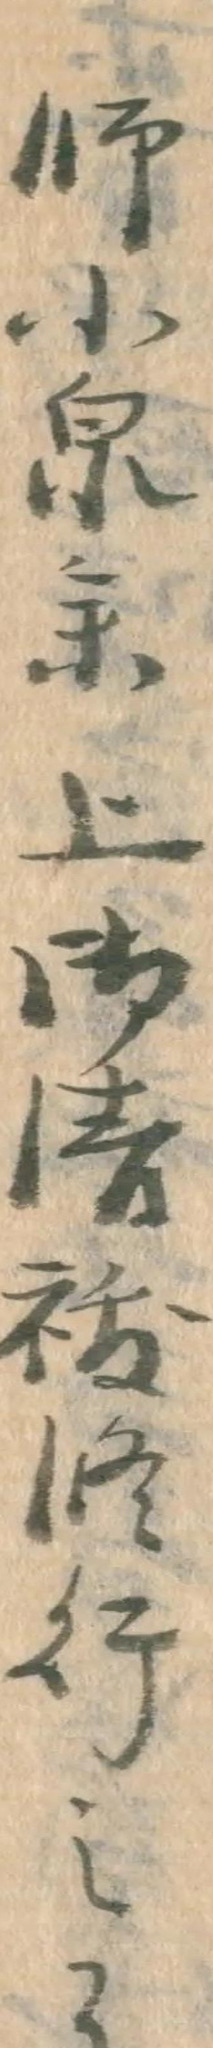師小泉参上、御清祓修行之了、
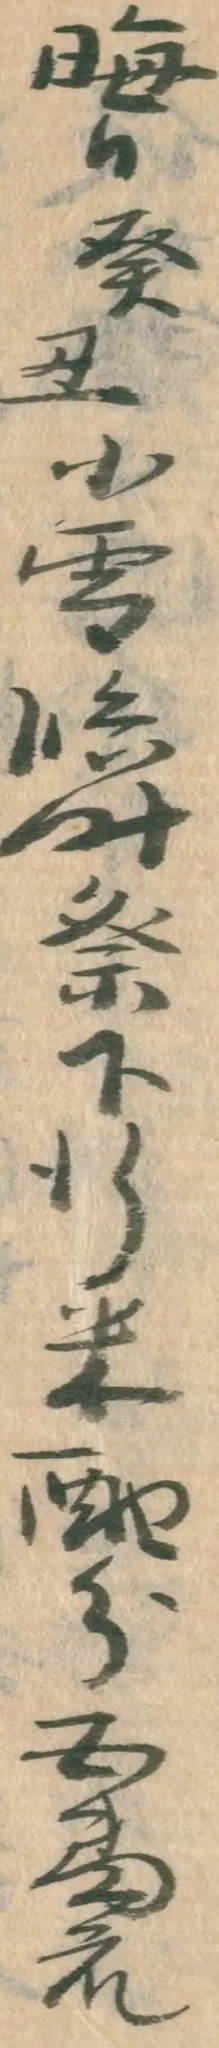晦日癸丑小雪、臨時祭下行米配分、五番衆・
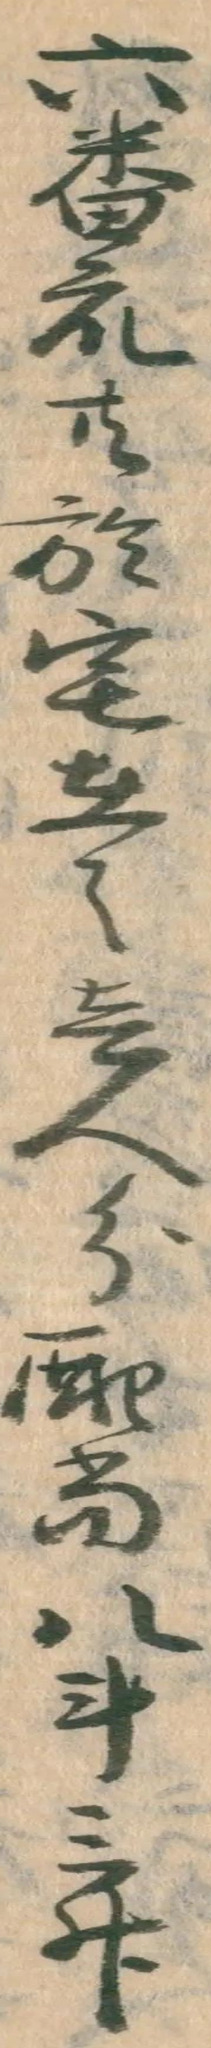六番衆共於宅在之壱人分配当八斗三升
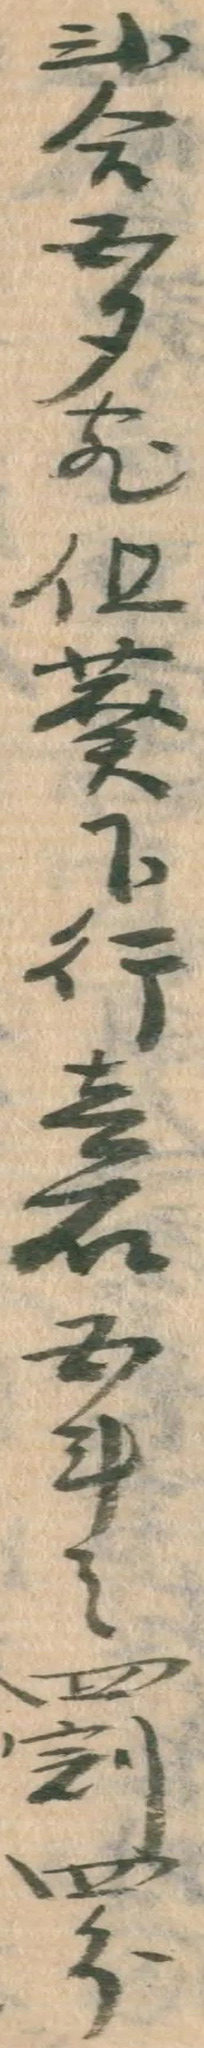弐合五勺宛、但葵下行壱石五斗之四割四分
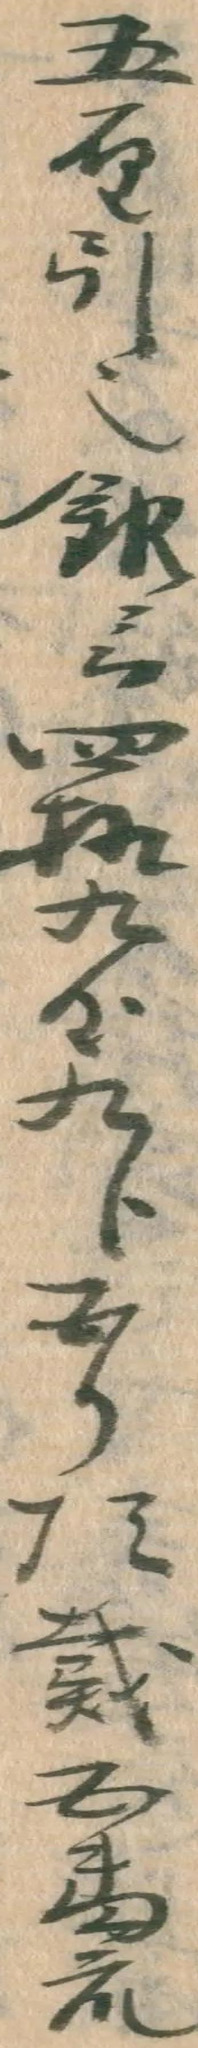五厘引也、銀ニ而四拾九匁九分五り頂戴、五番衆
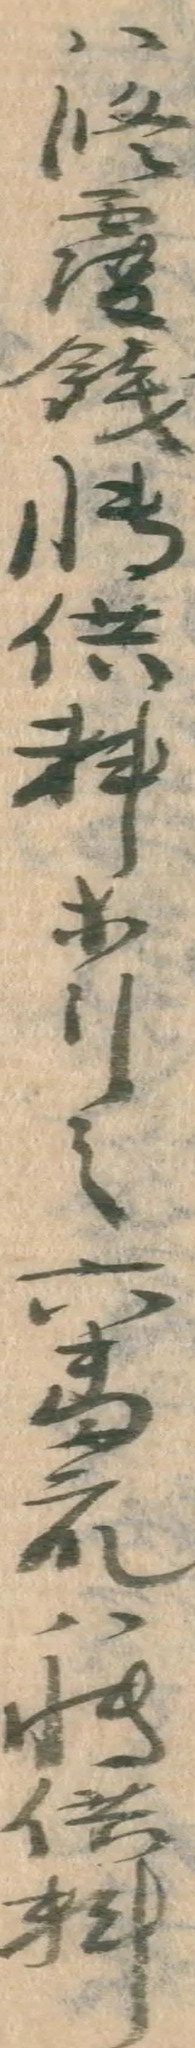ハ修覆銭・轉供料等引之、六番衆ハ轉供料
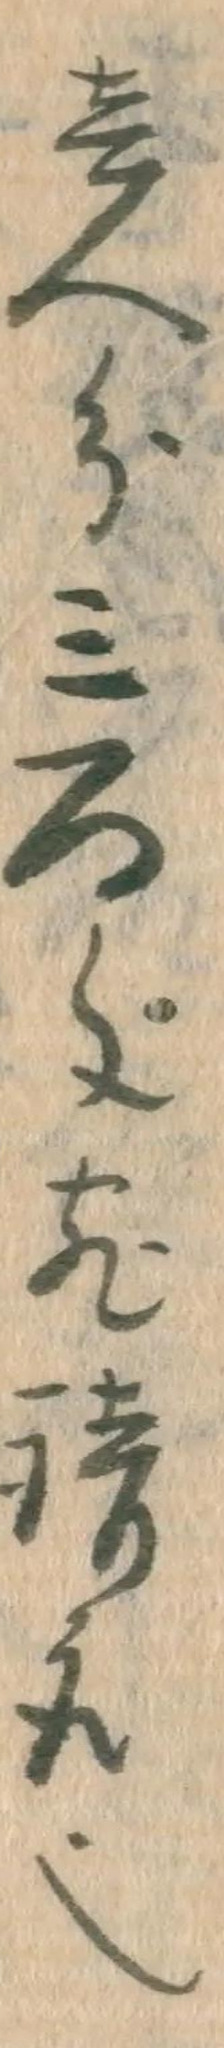壱人分三百文宛請取也、
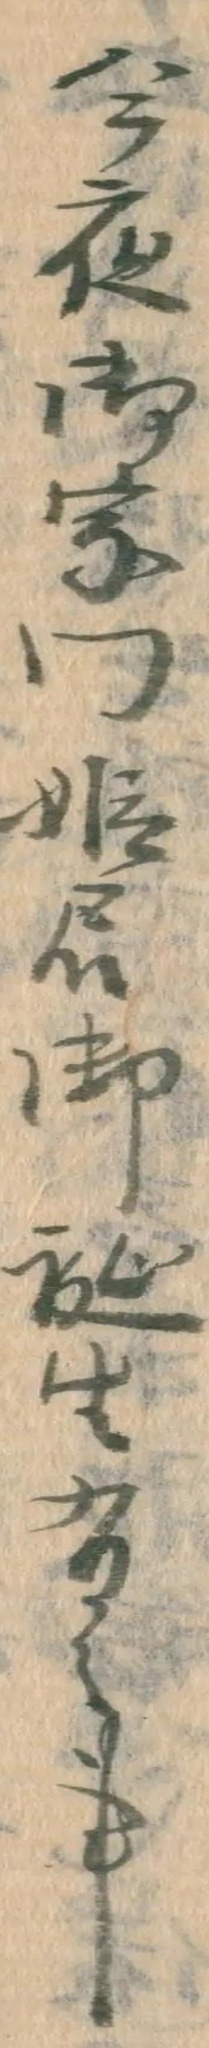今夜御家門姫君御誕生有之事、
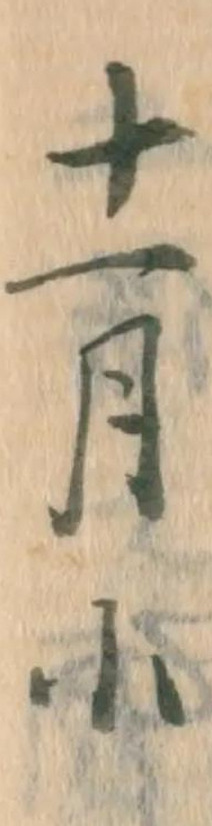十一月小
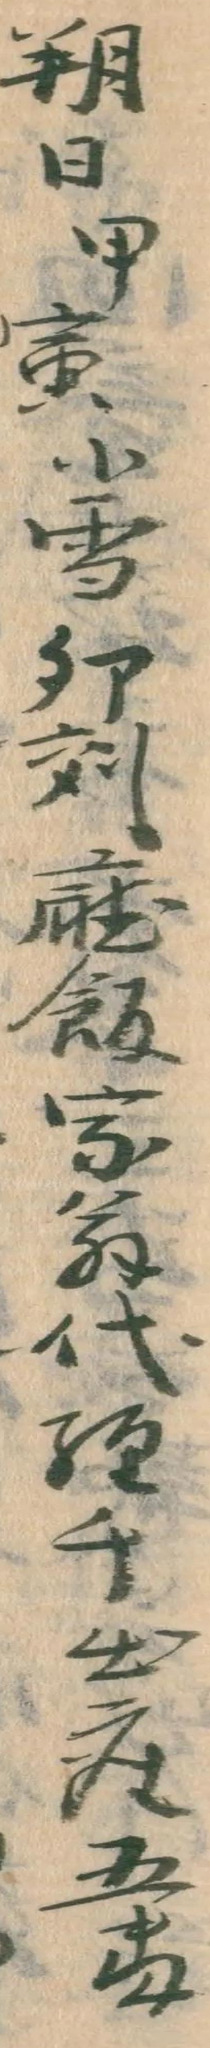朔日甲寅小雪、卯刻廳飯、家翁代経千出座、五番
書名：賀茂社記録. 第63冊
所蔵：国立国会図書館 National Diet Library, JAPAN
